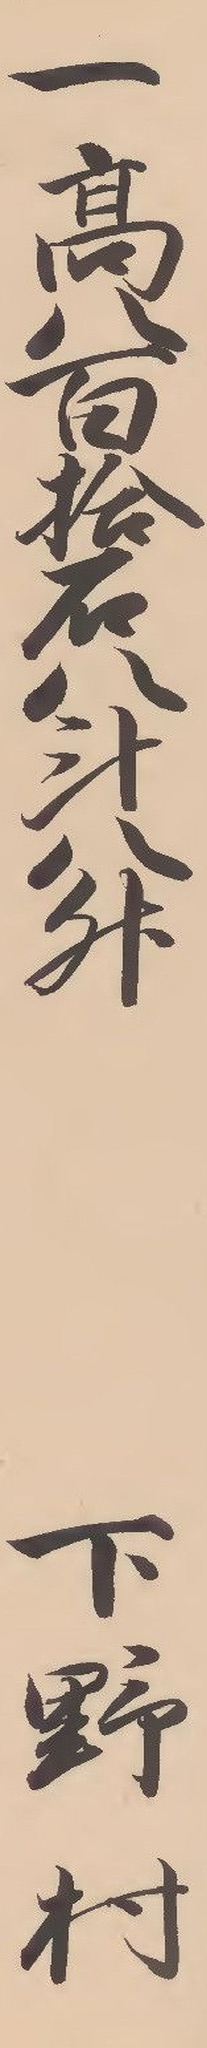一高八百拾石八斗八升下野村
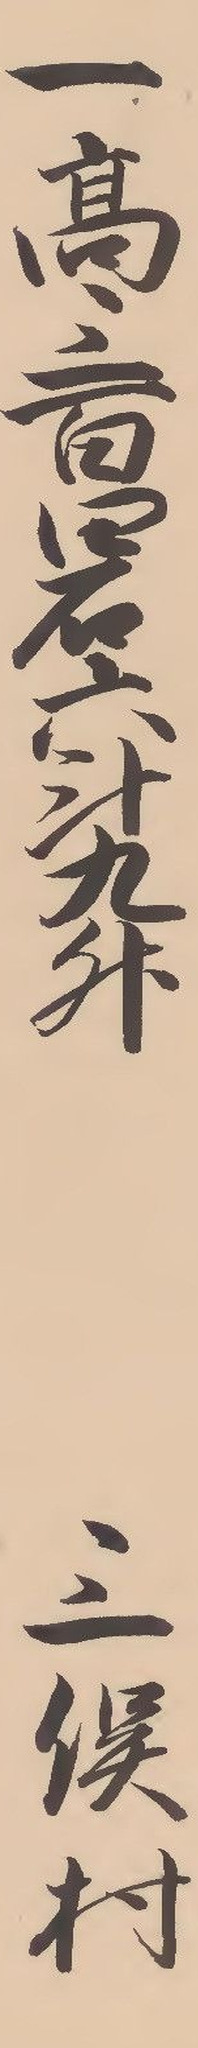一高三百四石六斗九升三俣村
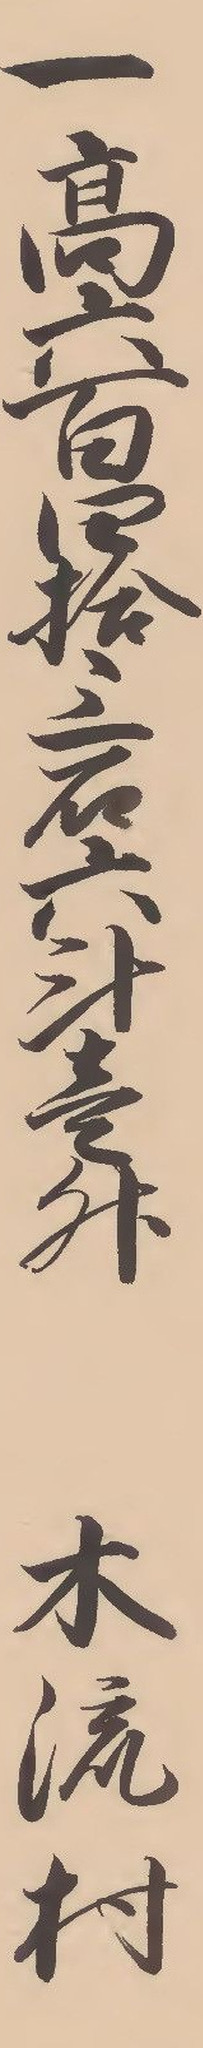一高六百四拾三石六斗壱升木流村
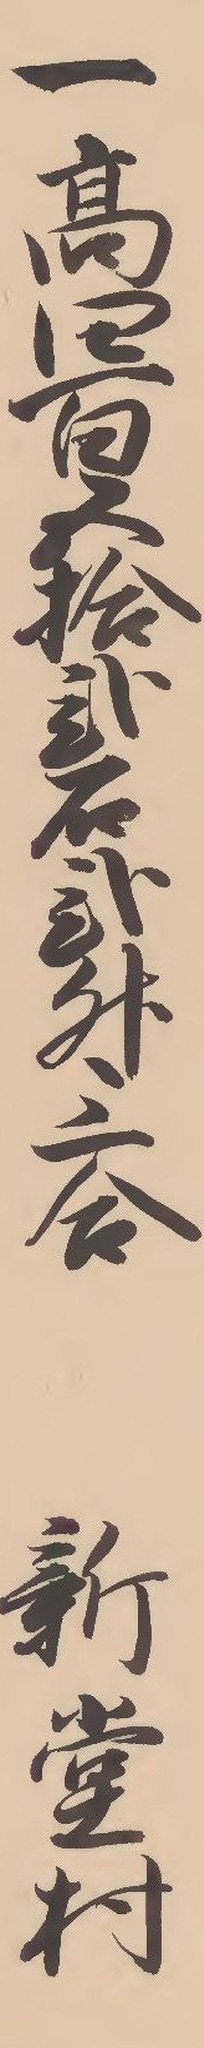一高四百五拾弐石弐升三合新堂村

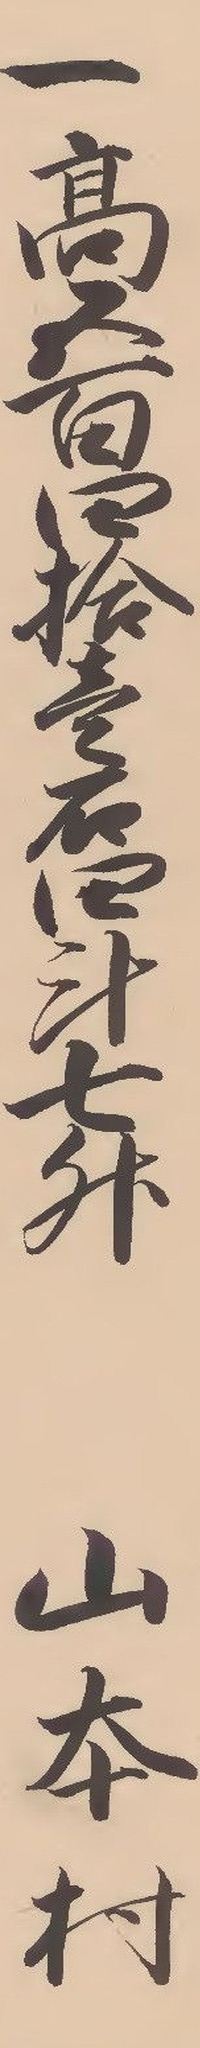一高五百四拾壱石四斗七升山本村
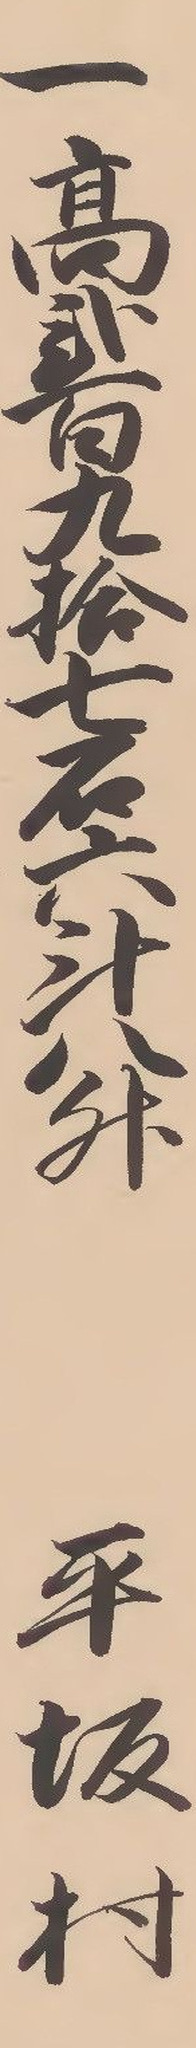一高弐百九拾七石六斗八升平坂村
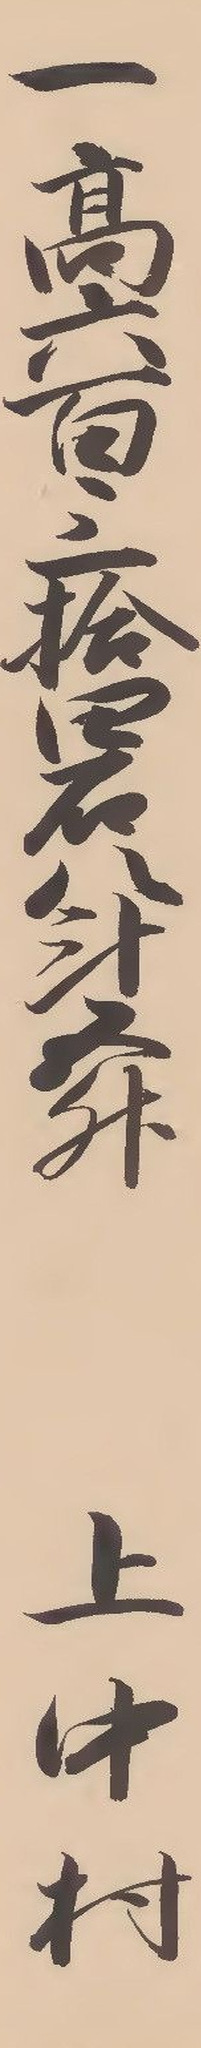一高六百三拾四石八斗五升上中村
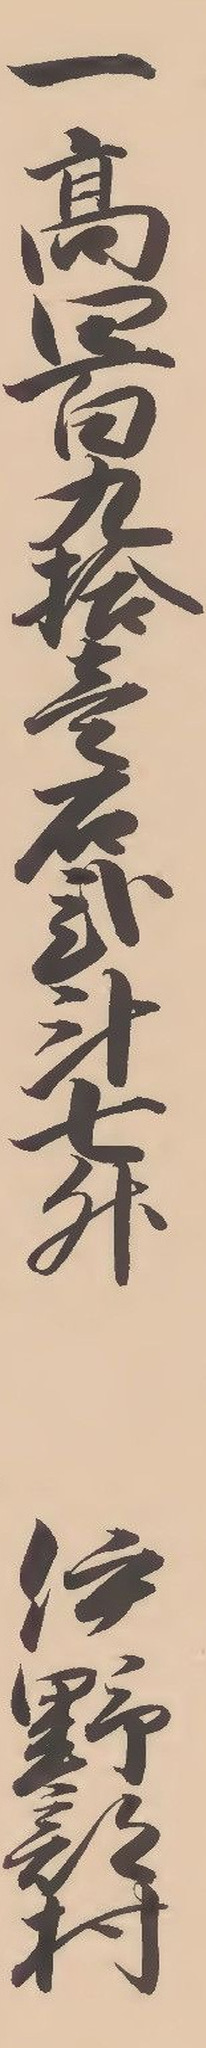一高四百九拾壱石弐斗七升伊野部村
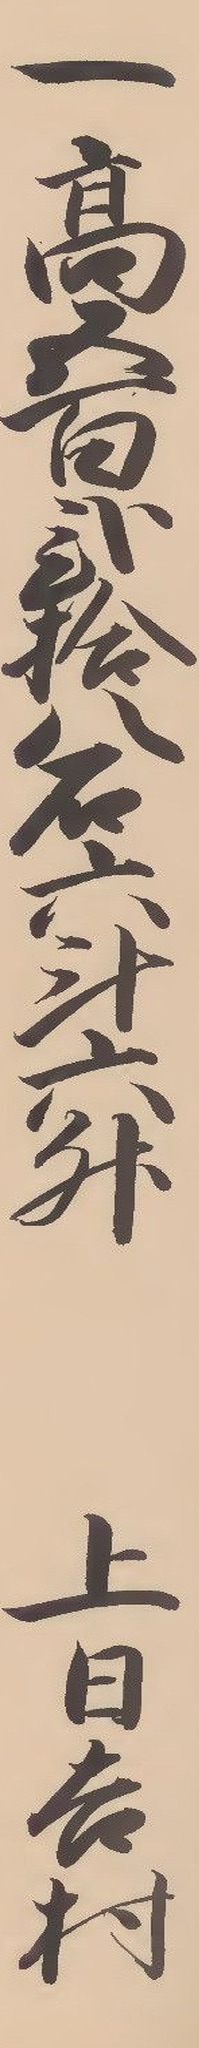一高五百弐拾八石六斗六升上日吉村
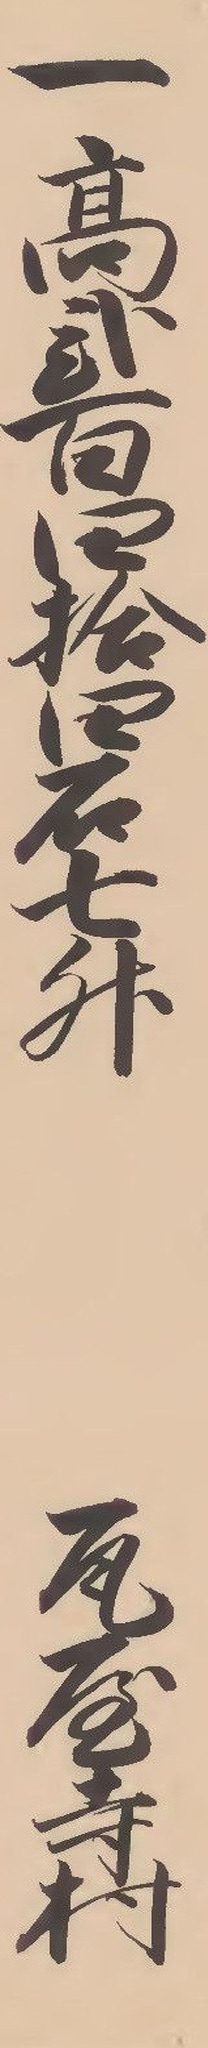一高弐百四拾四石七升瓦屋寺村
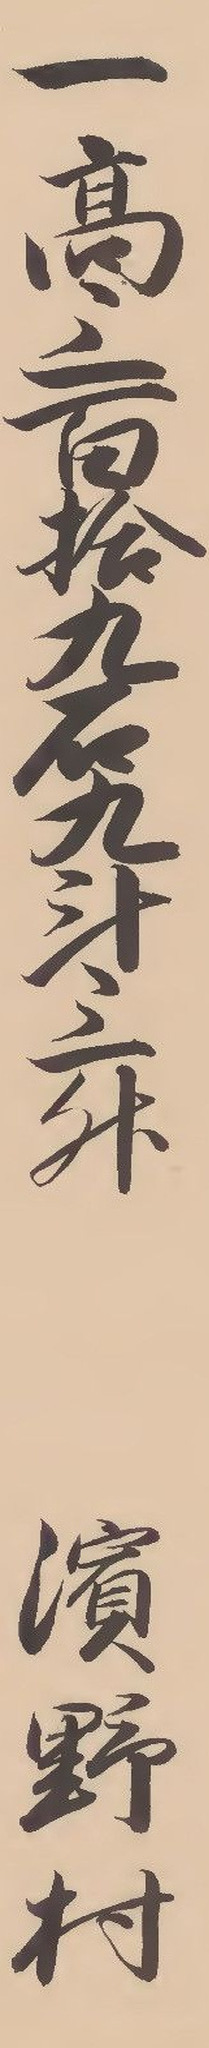一高三百拾九石九斗三升浜野村
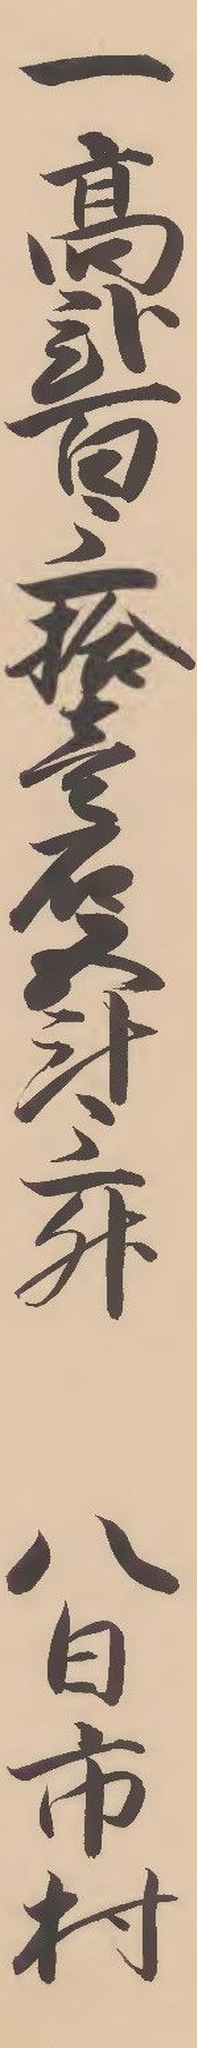一高弐百三拾壱石五斗三升八日市村

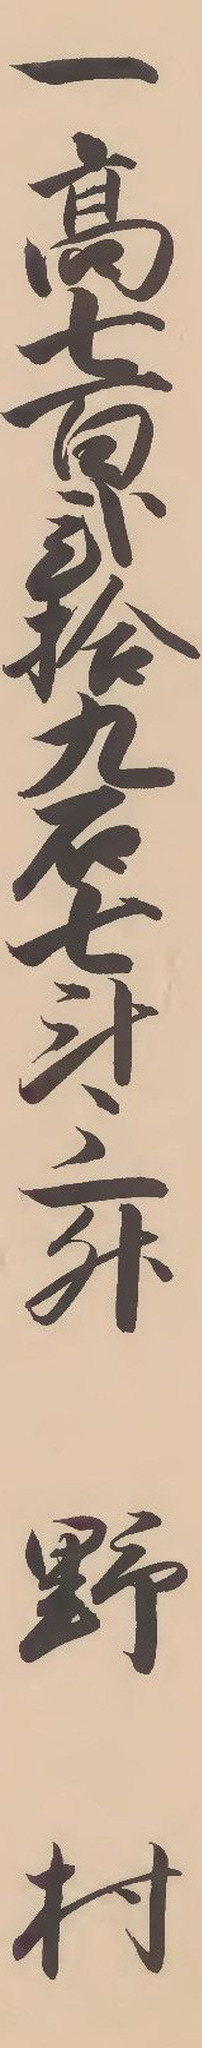一高七百弐拾九石七斗三升野村
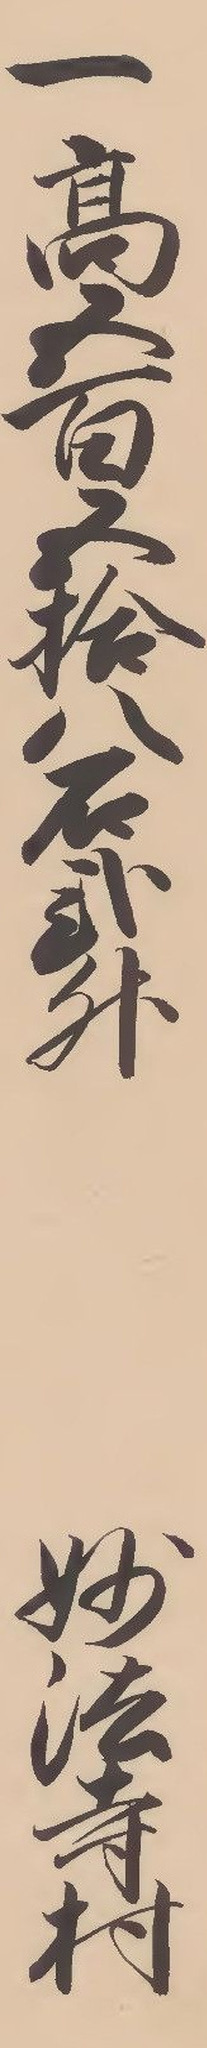一高五百五拾八石弐升妙法寺村
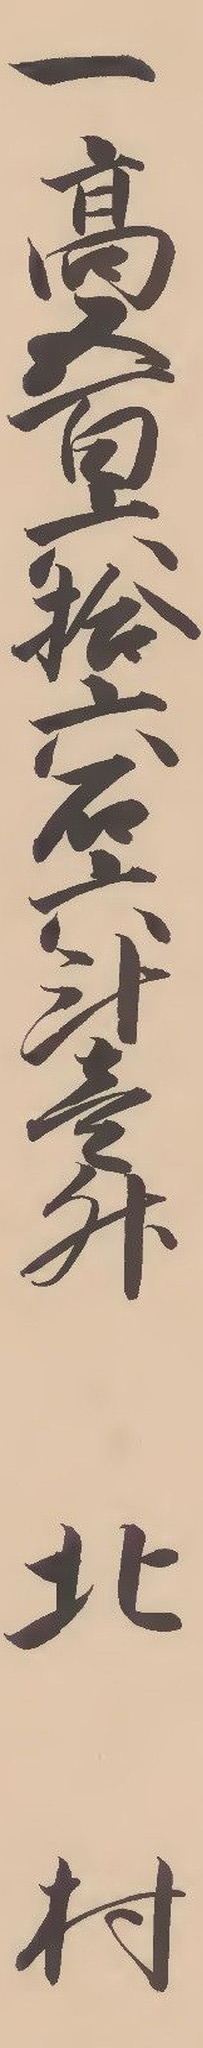一高五百六拾六石六斗壱升北村
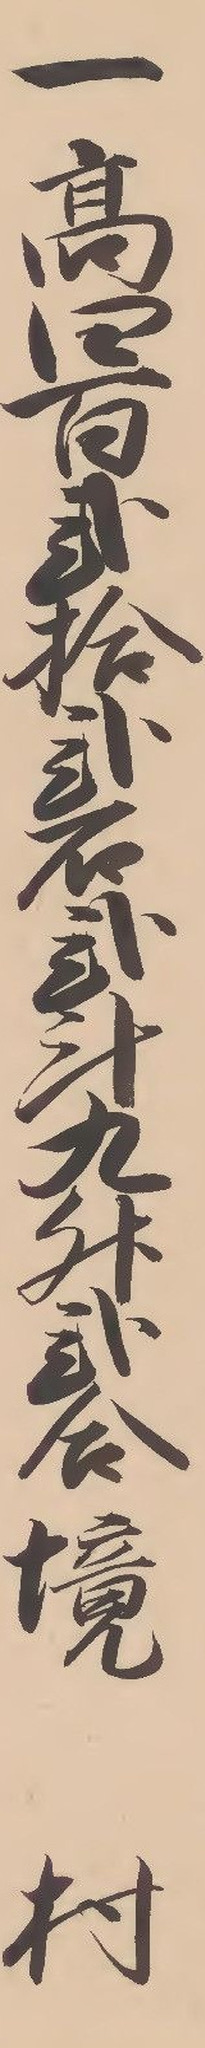一高四百弐拾弐石弐斗九升弐合境村
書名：近江国郷帳
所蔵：国立公文書館 National Archives of Japan
